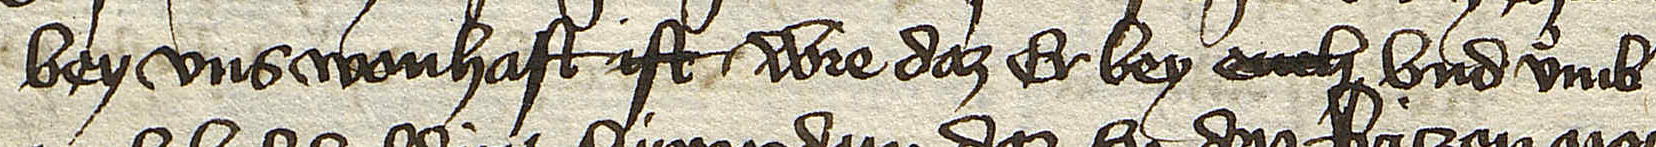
bey vns wonhaft iſt / wie daʒ Er bey euch vnd v̈mb
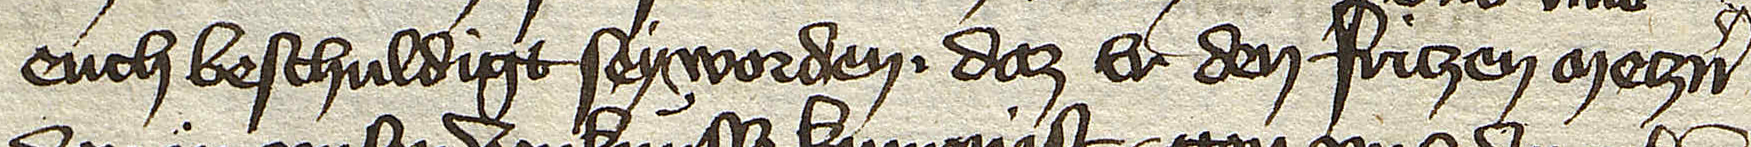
euch beſchuldigt ſey worden . daʒ Er den Fricʒen Mecʒn*
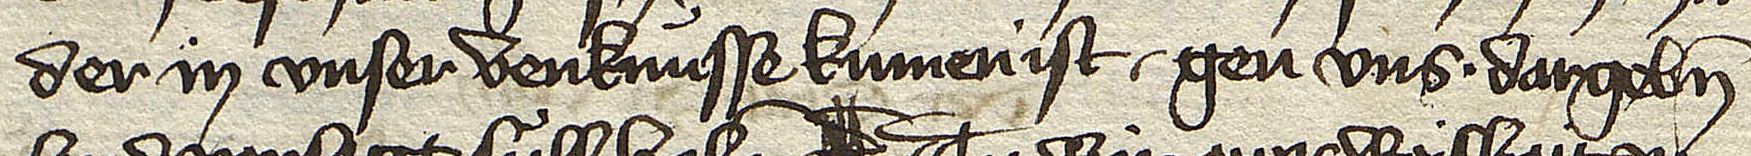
der in vnſer venknüſſe kumen iſt / gen vns . dargebn*
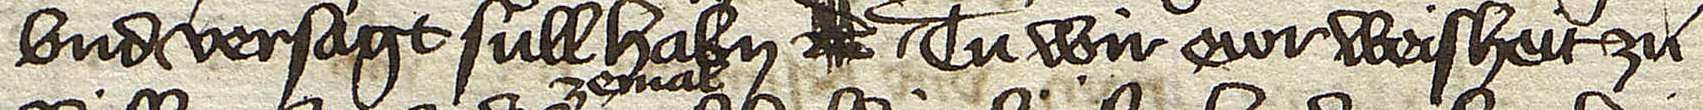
vnd verſagt ſüll habn* ec* / Tu wir ewr weiſheit ʒu
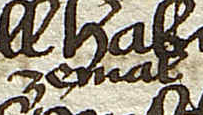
ʒemal
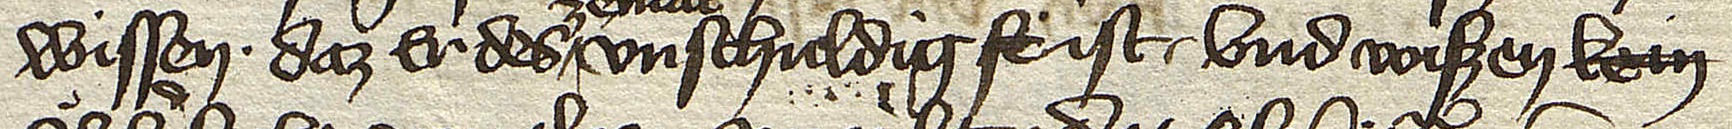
wiſſen . daʒ Er des vnſchuldig ſe iſt / vnd wiſʒen kein
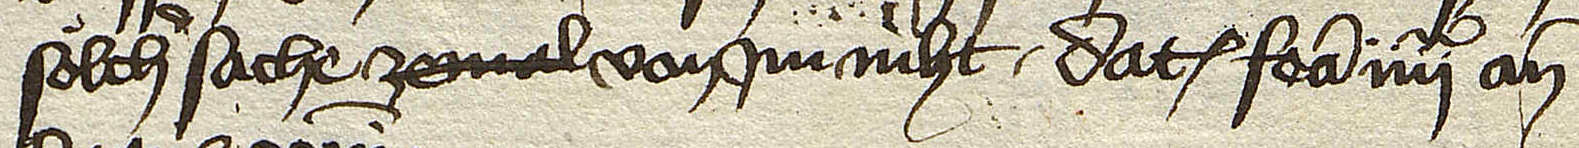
ſölch* ſache ʒemal von Im niht / Dat* fea* iiii* an*
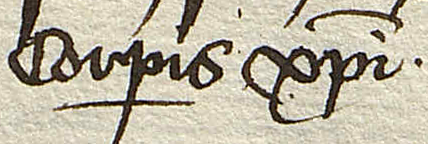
Corpis* xpi* .
